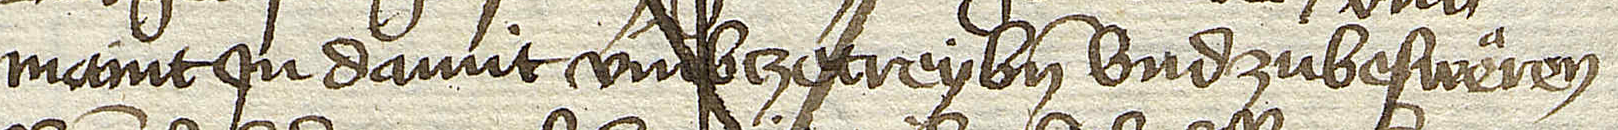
maint In damit vmbcʒetreybn* vnd ʒubeſwëren
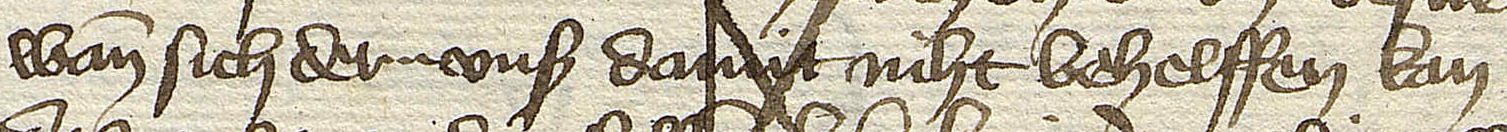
wan* ſich der ~ vnſ* damit niht behelffen kan
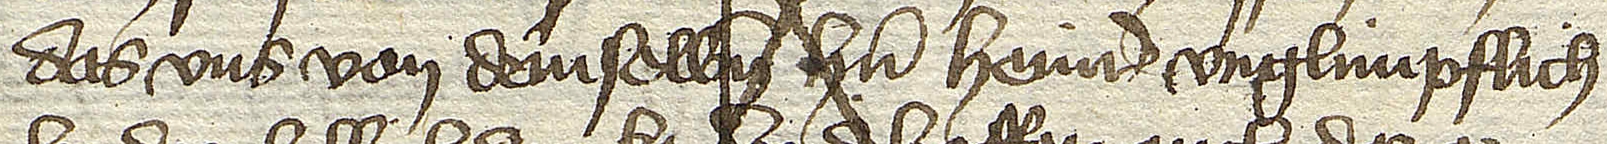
das vns von demſelbn* hn* heinr* vnglimpflich
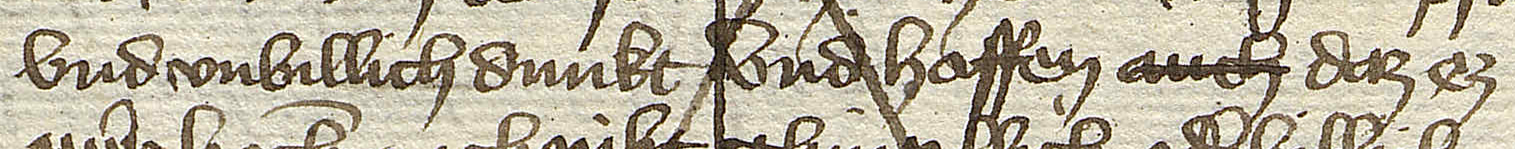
vnd vnbillich dunkt Vnd hoffen auch daʒ eʒ
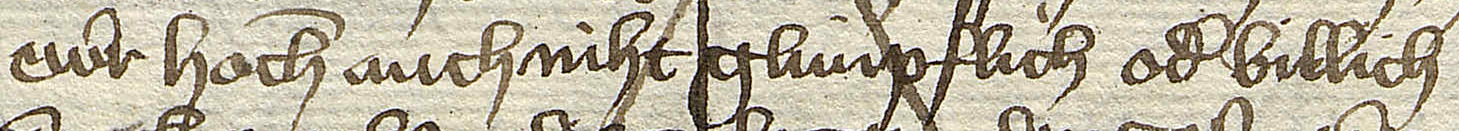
ew*r hoch* auch niht glimpflich od* billich
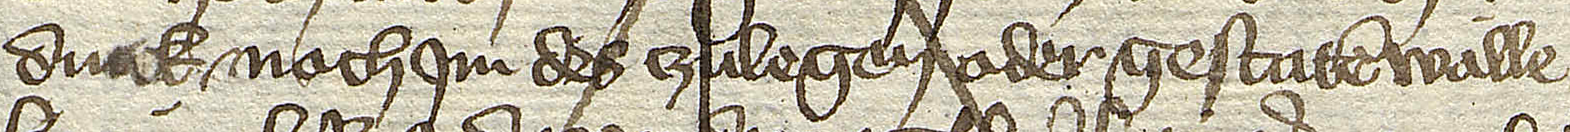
dunk / noch Im des cʒulegen oder geſtate* wölle
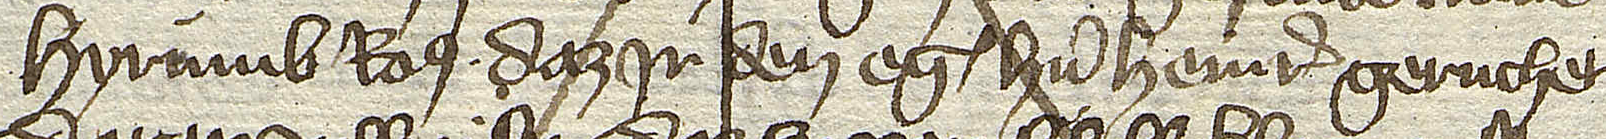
hyrümb Ro* . daʒ Ir den eg* hn* heinr* geruchet
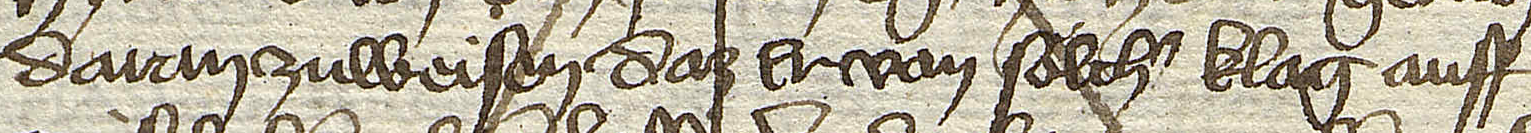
daran cʒuweiſen / daʒ Er von ſölich* klag auff
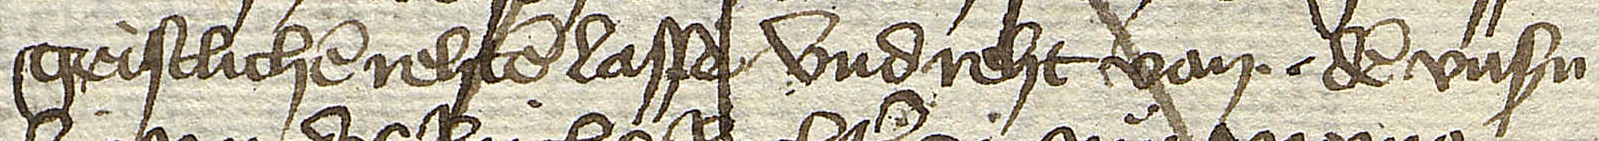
geiſtliche* rehte* laſſe / Vnd reht von ~ de* vnſ*n
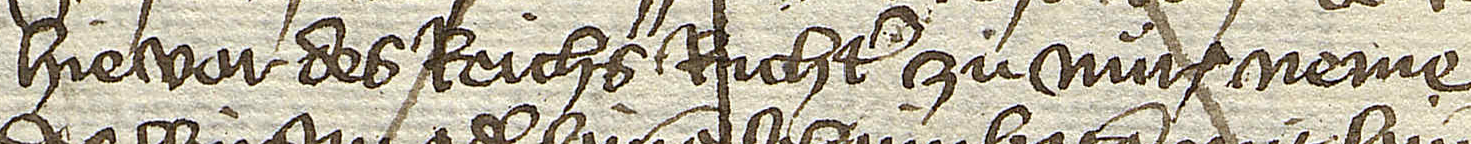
hier vor des Reichs Richt* cʒu Nür* neme
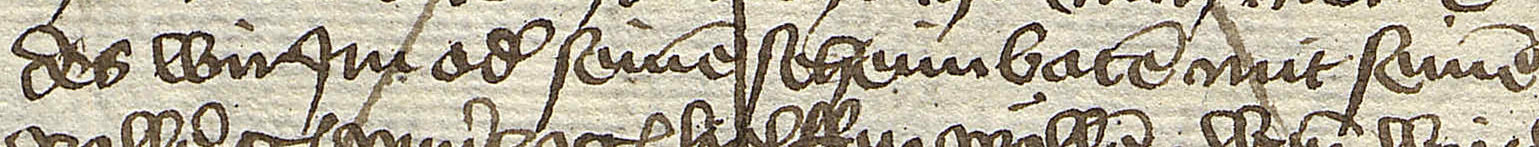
des wir Im od* ſeine* ſcheinbote* mit ſeine*
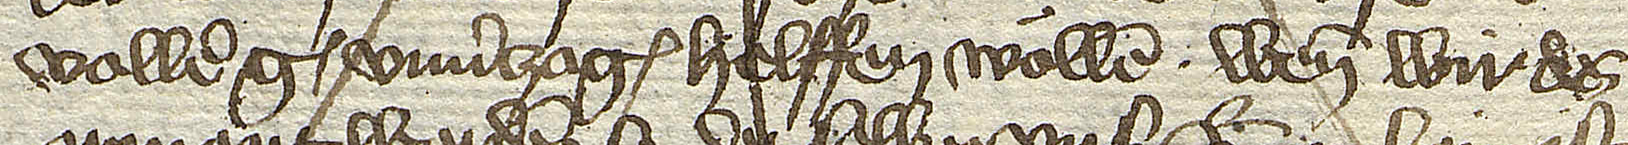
volle* g* vnu*cʒog* helffen wölle* . wen* wir des
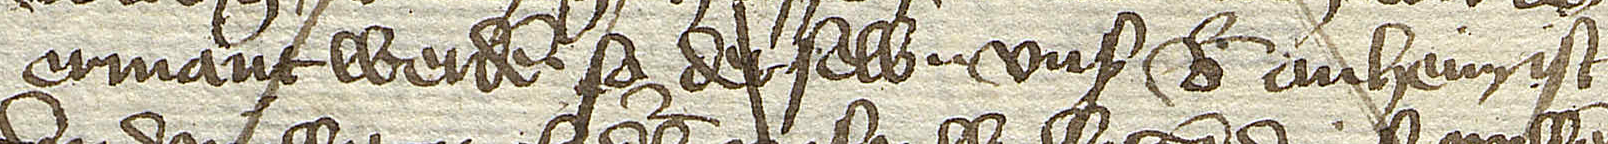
ermant werde* ſo derſelb ~ vnſ* B* anheim iſt
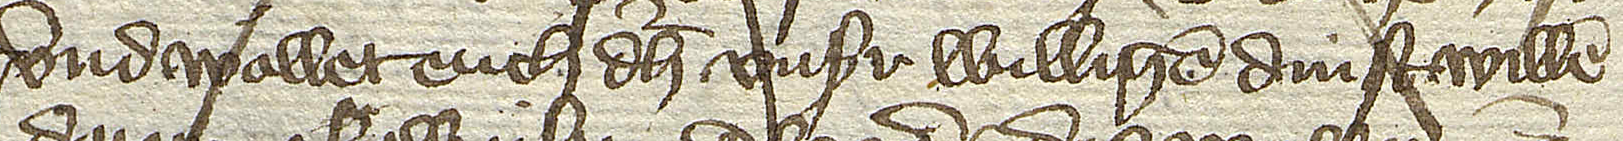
vnd wöllet euch dh* vnſ*r willige* dinſt wille*
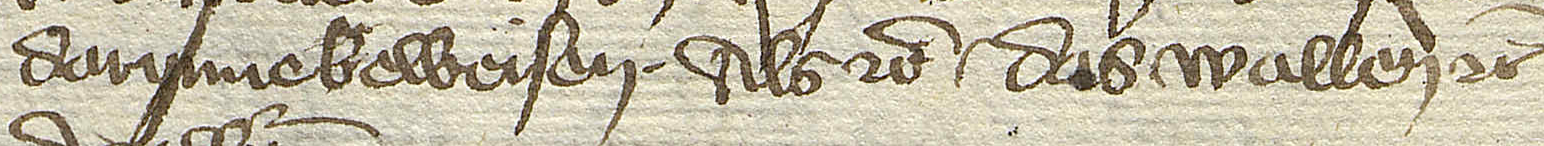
darynne beweiſen / Als ec* / Das wollen ec*
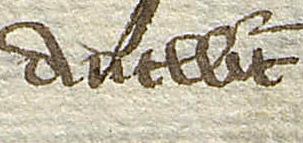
Antw*t
